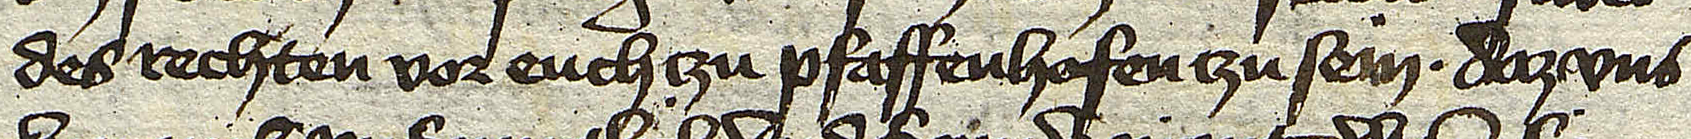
des rechten vor euch cʒu pfaffenhofen cʒu ſein . daʒ vns
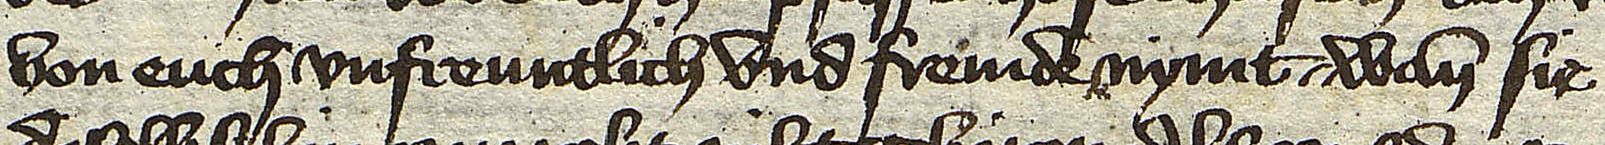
von euch vnfreuntlich vnd fremde nymt / wan* ſie
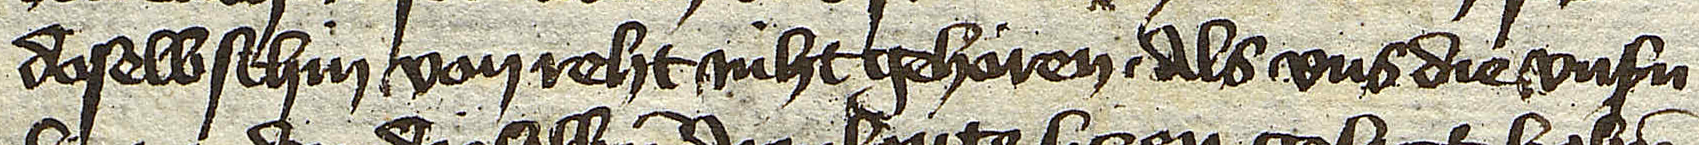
doſelbſthin von reht niht gehören . Als vns die vnſ*n
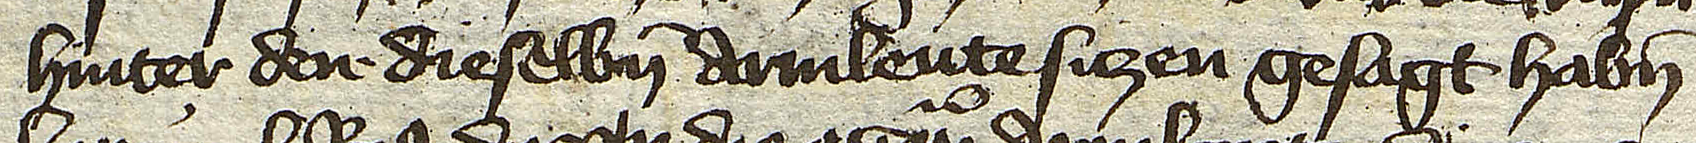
hinter den . dieſelb*n Armleute ſicʒen geſagt hab*n
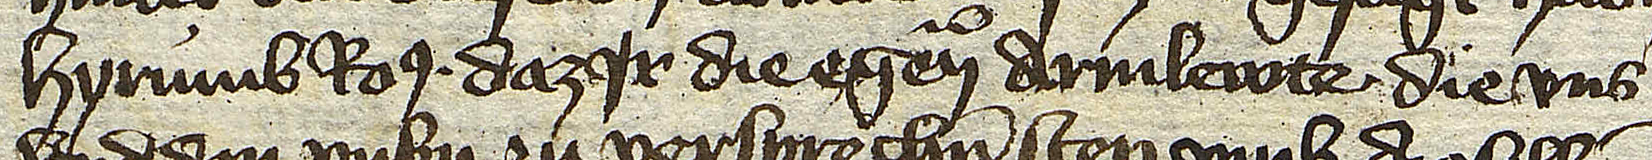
Hyrümb Ro* . daʒ Ir die egen* Armlewte die vns
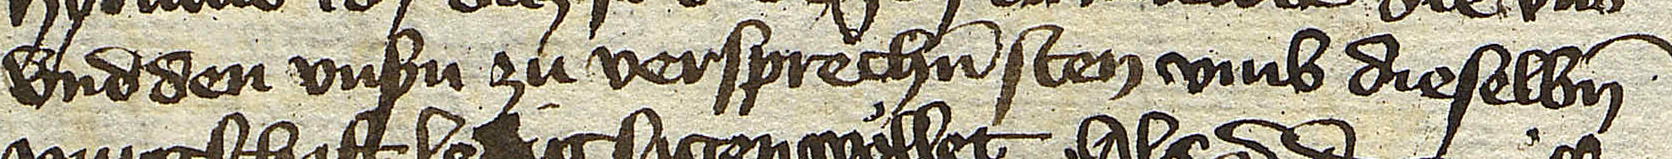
vnd den vnſ*n ʒu verſprech*n ſten vmb dieſelb*n
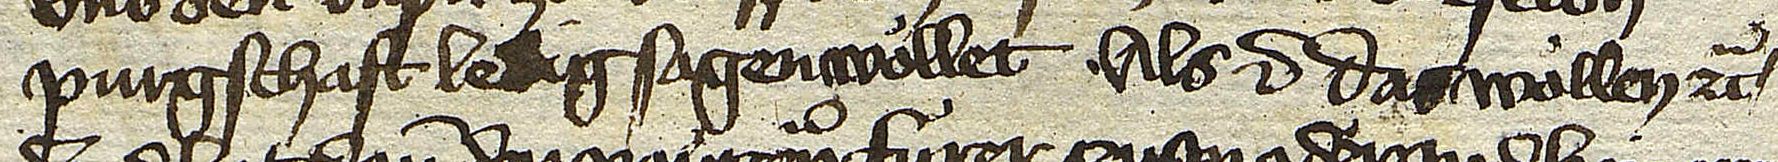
purgſchaft ledig ſagen wöllet . Als ec* das wöllen ec*
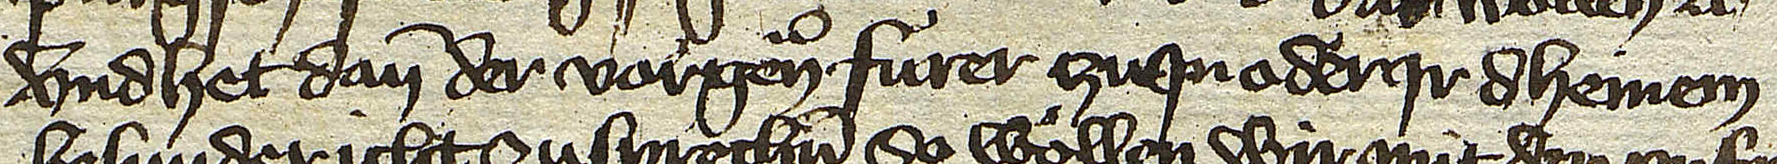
Vnd het dan* der vorgen* fürer cʒu In oder Ir dheinem
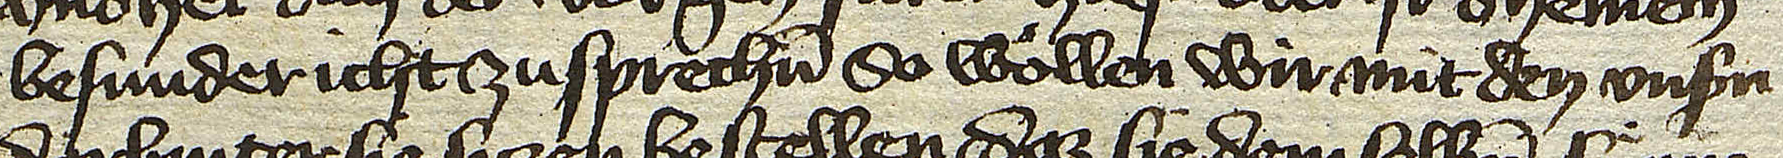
beſunder icht cʒuſprech*n So wöllen wir mit den vnſ*n
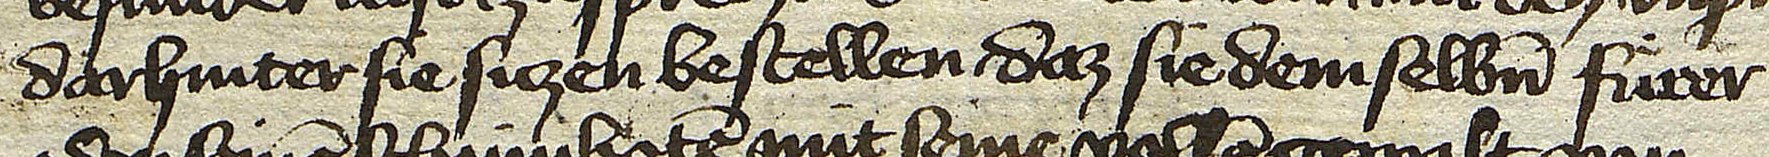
dar hinter ſie ſicʒen beſtellen / daʒ ſie demſelb*n fürer
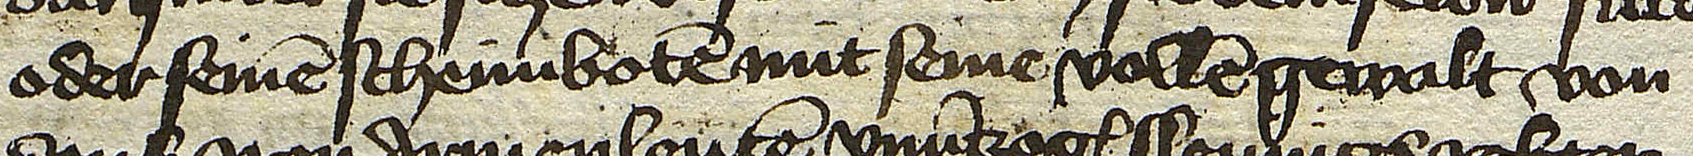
oder ſeine* ſcheimbote* mit ſeine volle* gewalt von
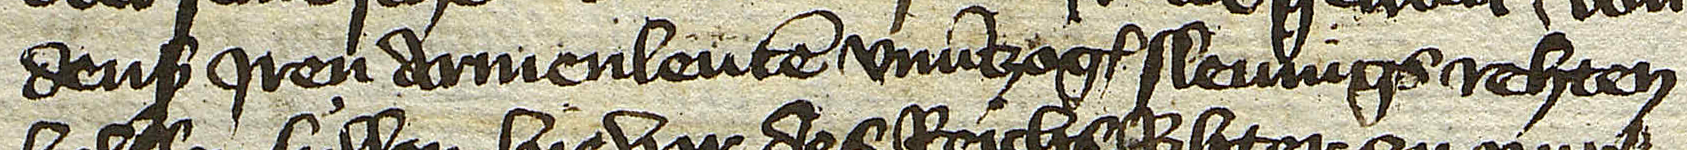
denſ* Iren Armenleute* vnu*cʒog* ſleunigs rehten
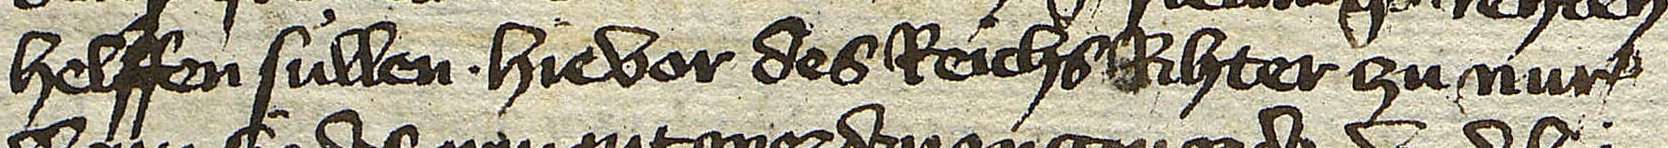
helffen ſüllen . hie vor des Reichs Rihter cʒu nur*
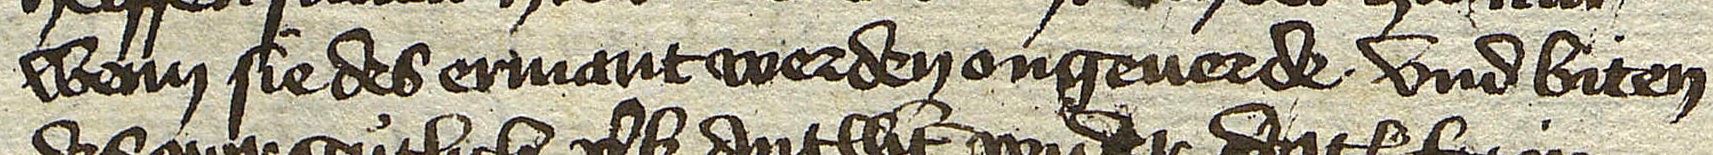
wenn ſie des ermant werden ongeuerde . Vnd biten
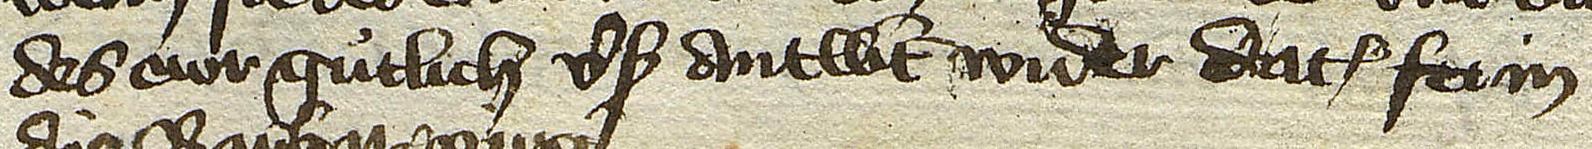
das ewr gütlich v*ſ* Antw*t wider dat* fe in
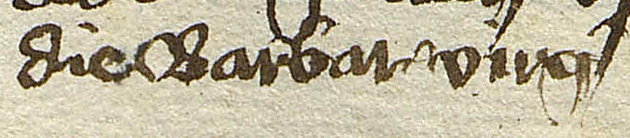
die Barbar* virg*
